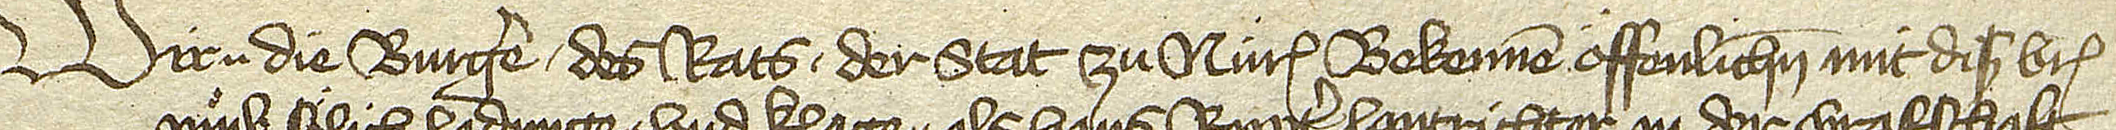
Wir ~ die Burge* / des Rats / der Stat cʒu Nür* Bekenne* öffenlichn* mit diſ* br*
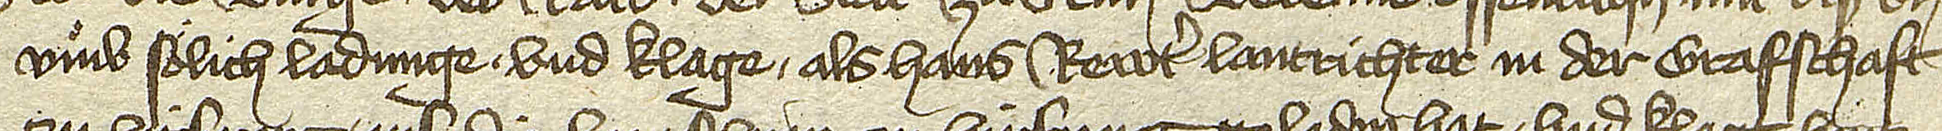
v̈mb ſölich ladunge / vnd klage / als hans Rewt* lantrichter in der Grafſchaft
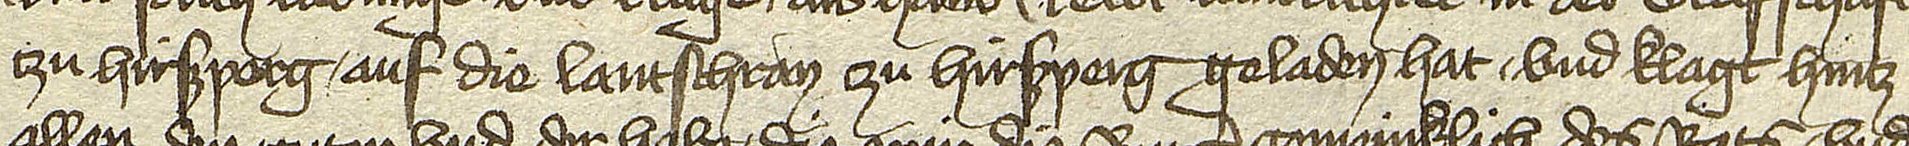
cʒu hirſ*perg / auf die lantſchran cʒu hirſʒperg geladen hat / vnd klagt hincʒ
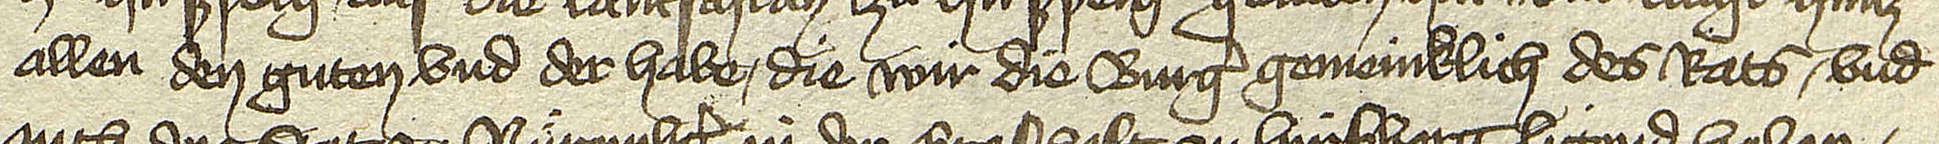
allen den guten vnd der habe / die wir die Burg* gemeinklich des Rats / vnd
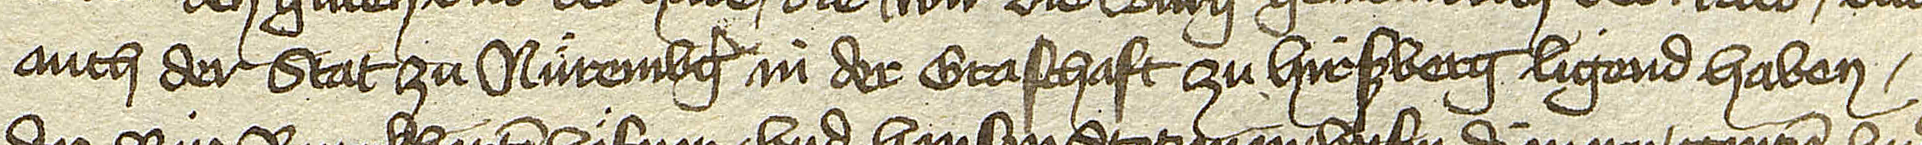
auch der Stat cʒu Nürembg* in der Graſchaft cʒu hirſʒberg ligend haben /
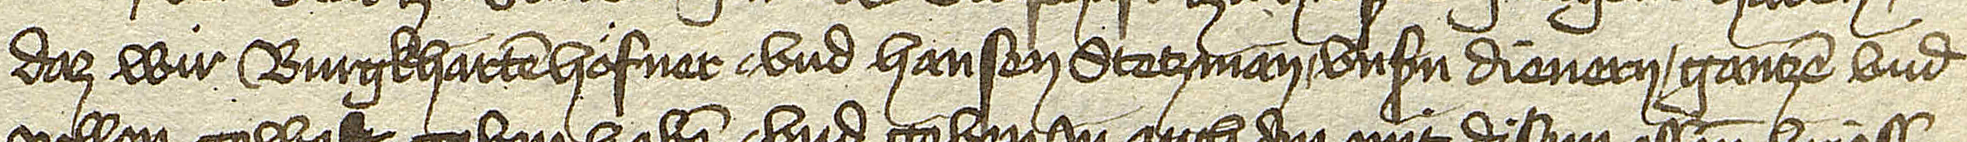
daʒ wir Burgkharte* höfner / vnd hanſen Stecʒman / vnſ*n dienern / gancʒe vnd
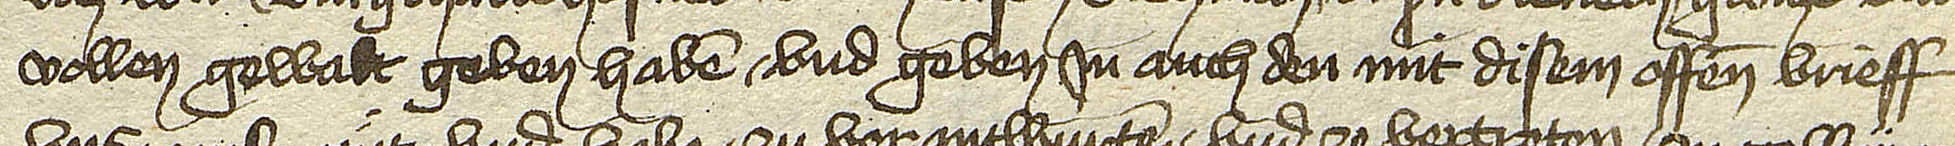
vollen gewalt geben habe* / vnd geben In auch den mit diſem offen brieff
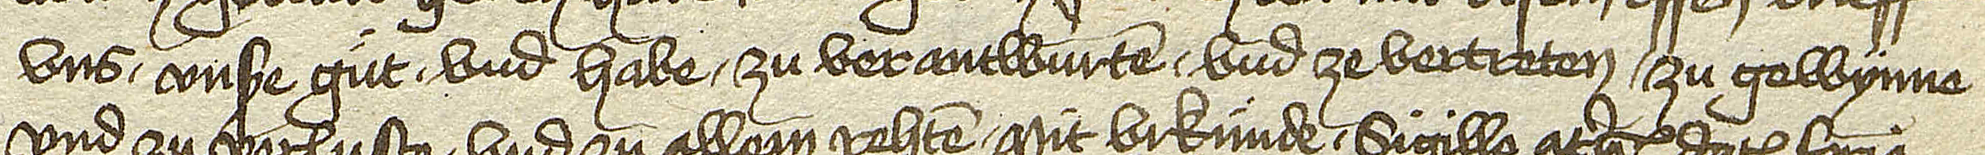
vns / vnſ*e güt / vnd habe / cʒu verantwurte* / vnd cʒe vertreten / cʒu gewynne
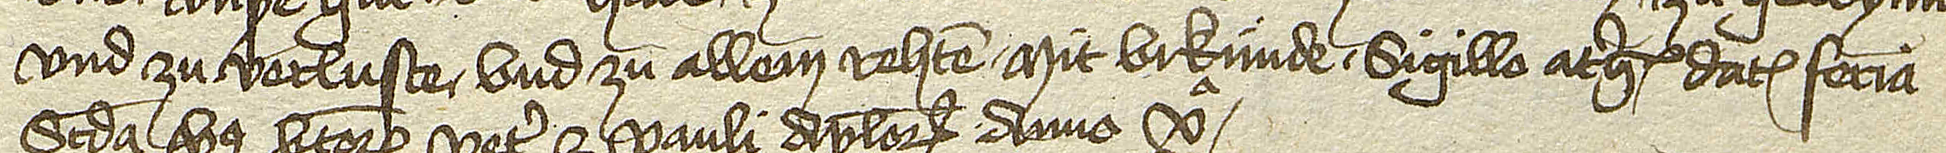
vnd cʒu verluſte / vnd cʒu allem rehte* / Mit vrkünde / Sigillo at*g* dat* feria*
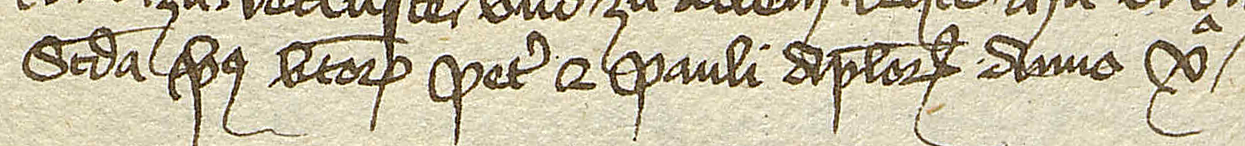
Scda* / p* bto* Pet* @ Pauli Aplo* Anno x* /
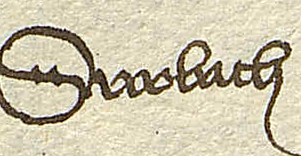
Swobach
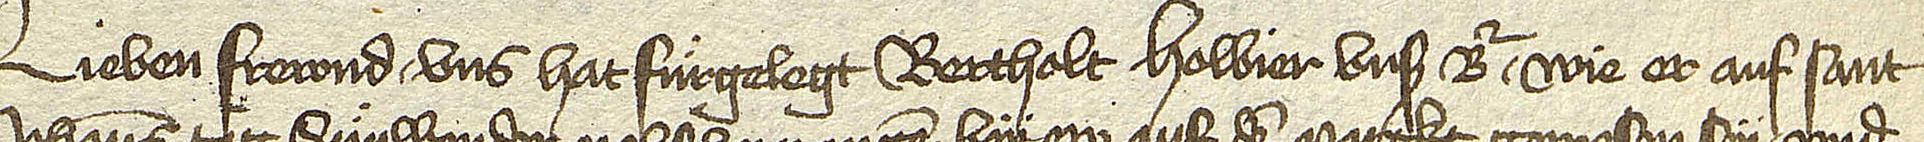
Lieben frewnd / vns hat fürgelegt Bertholt holbier vnſ* B* / wie er auf ſant
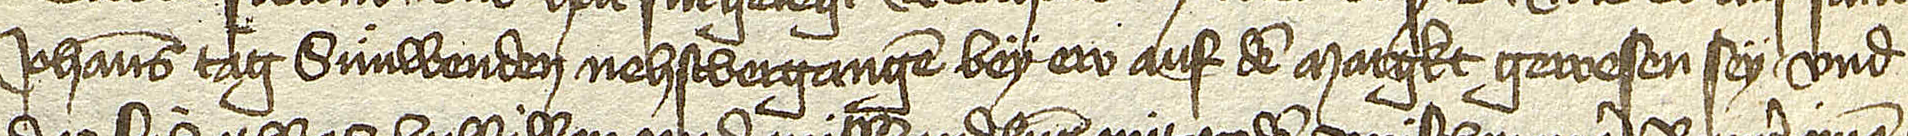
Iohans* tag Sünwenden nehſtvergange* bey ew auf de* Margkt geweſen ſey / vnd
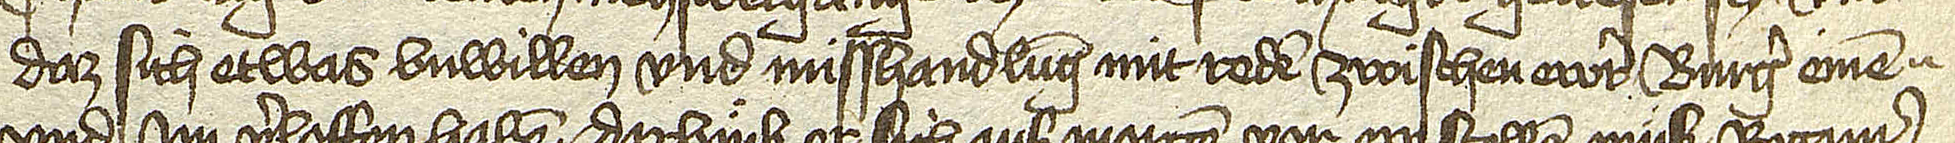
daʒ ſich etwas vnwillen vnd miſſhandlug* mit rede* cʒwiſchen ewr* Burg* eine* ~
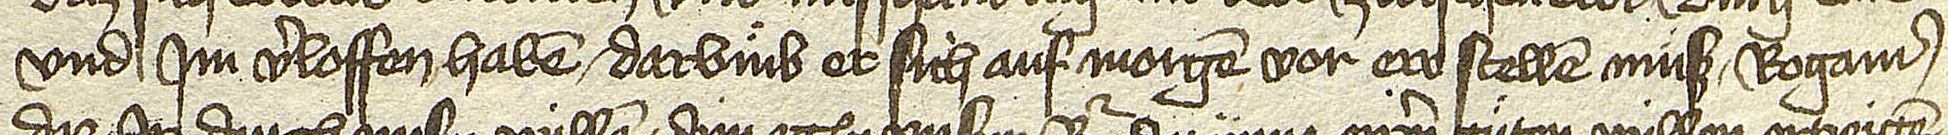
vnd Im v*loffen habe* / darv̈mb er ſich auf morge* vor ew ſtelle* müſʒ / Rogam* /
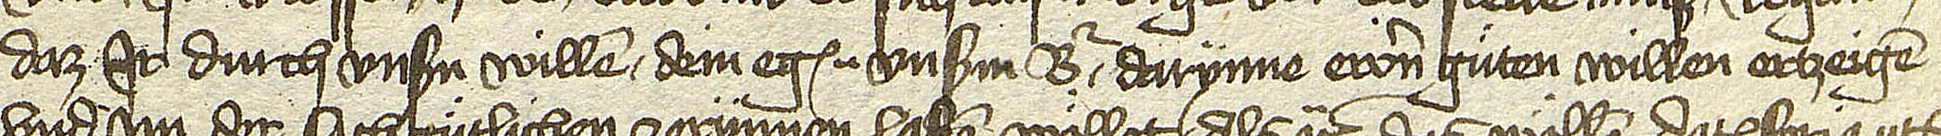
daʒ Ir durch vnſ*n wille* / dem eg* ~ vnſ*m B* / darynne ewn* güten willen ercʒeige*
